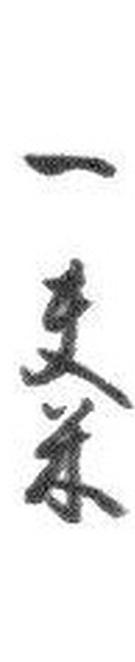一夫米
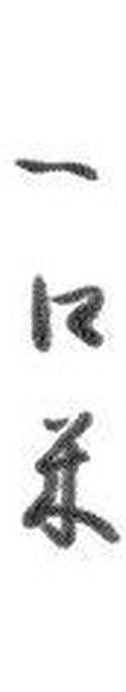一口米

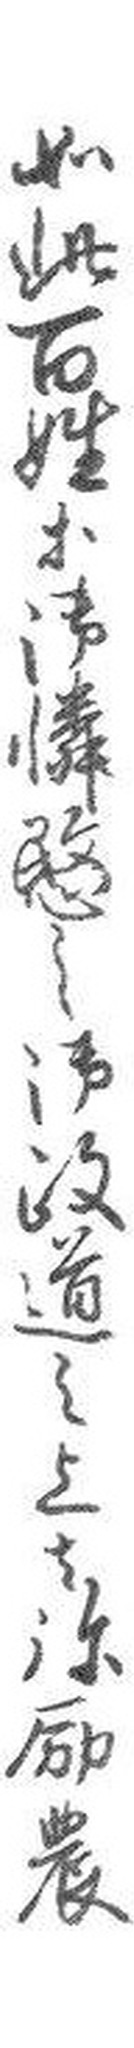如此百姓等御憐愍之御政道之上者弥励農
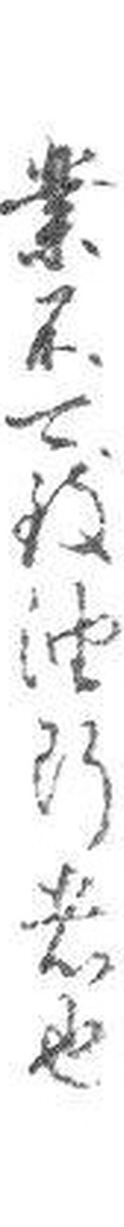業不可致油断者也
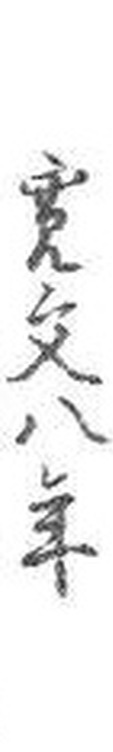寛文八年
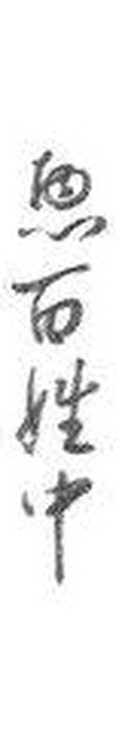惣百姓中
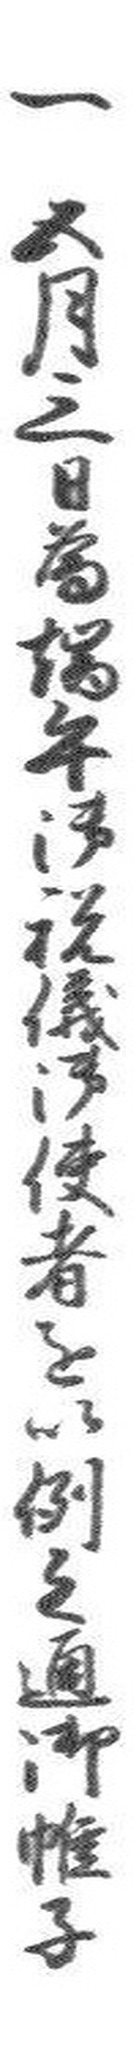一五月三日為端午御祝儀御使者を以例之通御帷子
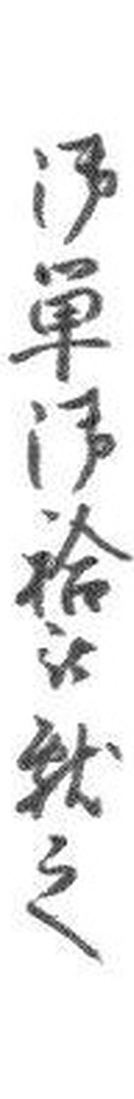御単御袷被献之
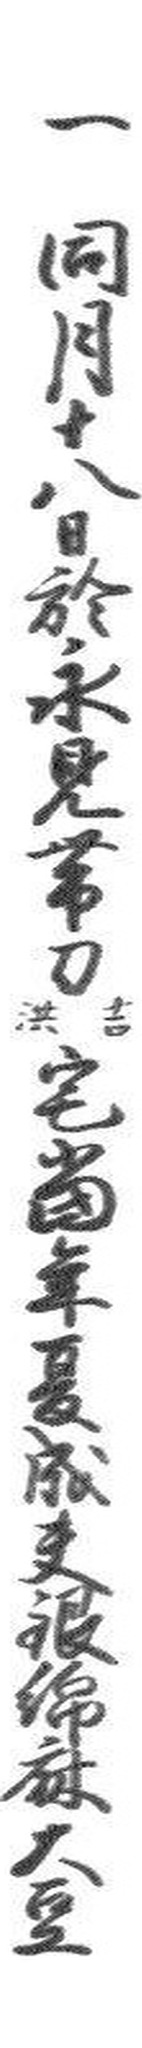一同月十八日於永見帯刀吉洪宅当年夏成夫銀綿麻大豆
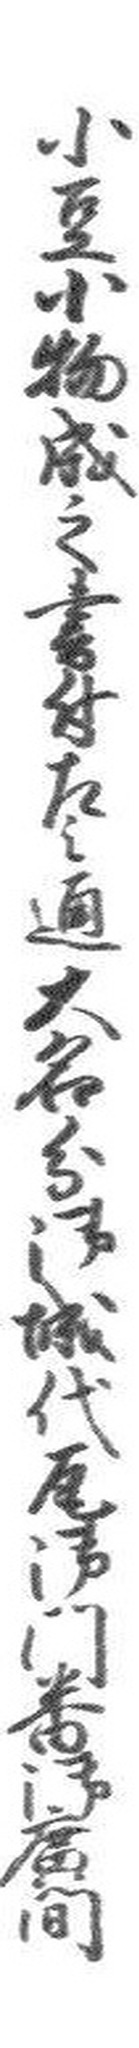小豆小物成之書付左之通大名分御城代瓦御門番御広間
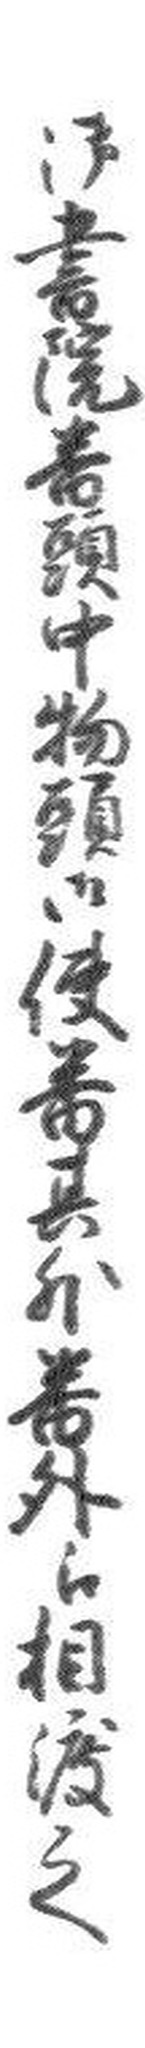御書院番頭中物頭御使番其外番外江相渡之
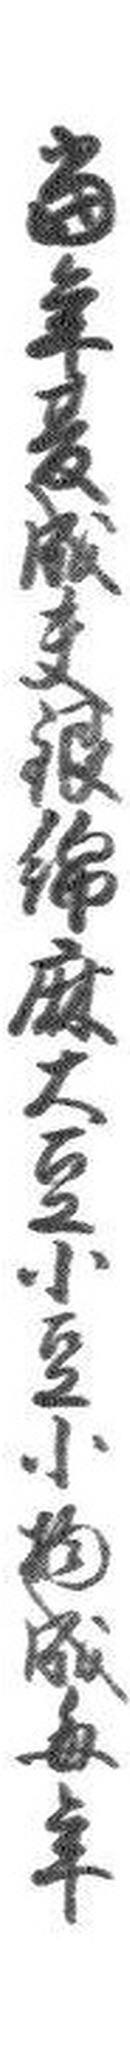当年夏成夫銀綿麻大豆小豆小物成毎年
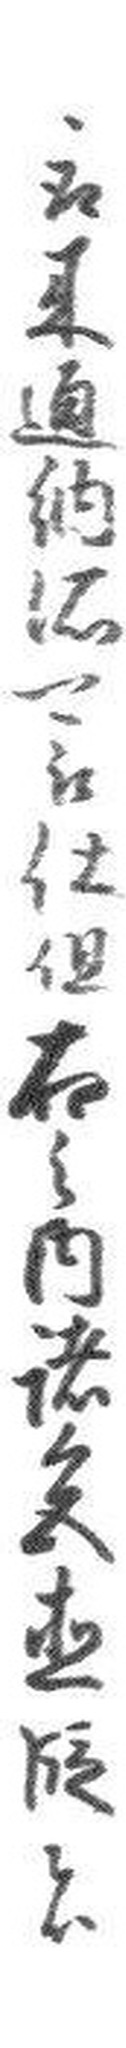取来通納所可被仕但右之内諸色直段者
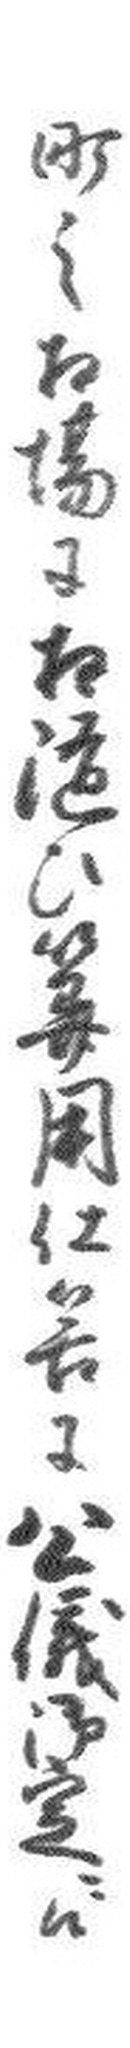町之相場に相随ひ算用仕筈に公儀御定ニ候
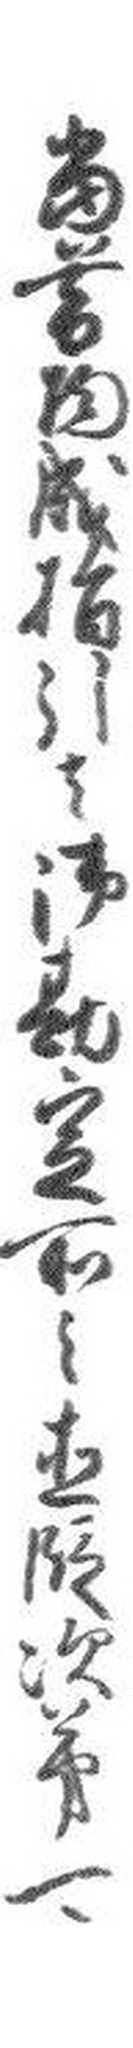当暮物成指引者御勘定所之直段次第可

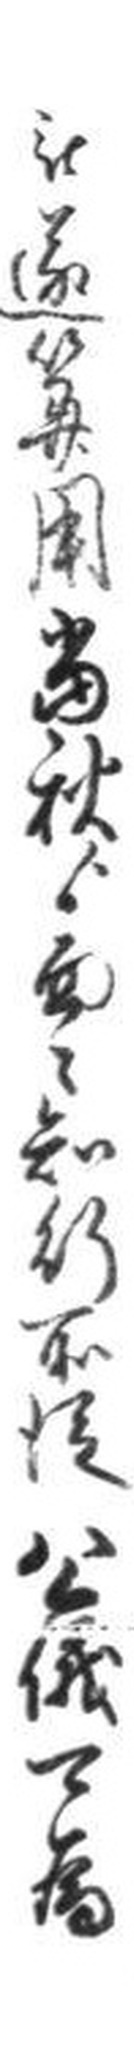被遂算用当秋ゟ面々知行所従公儀可為
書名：家譜 七 光通公 従寛文四年到同九年
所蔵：福井県文書館 Fukui Prefectural Archives
